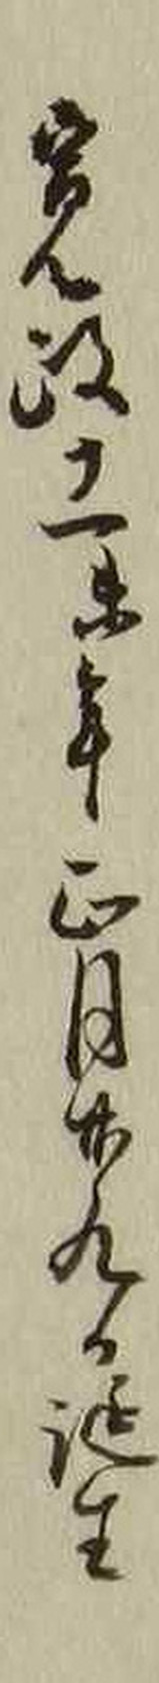女寛政十一未年正月廿九日誕生
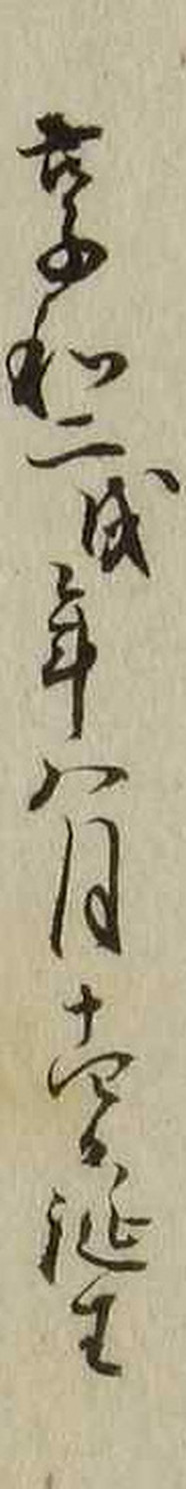女享和二戌年八月十四日誕生
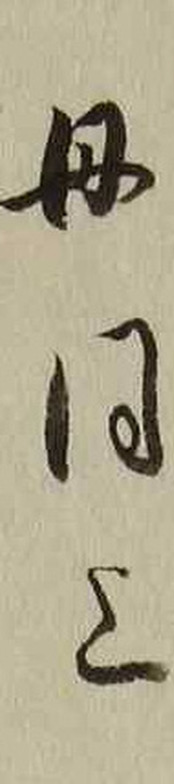母同上
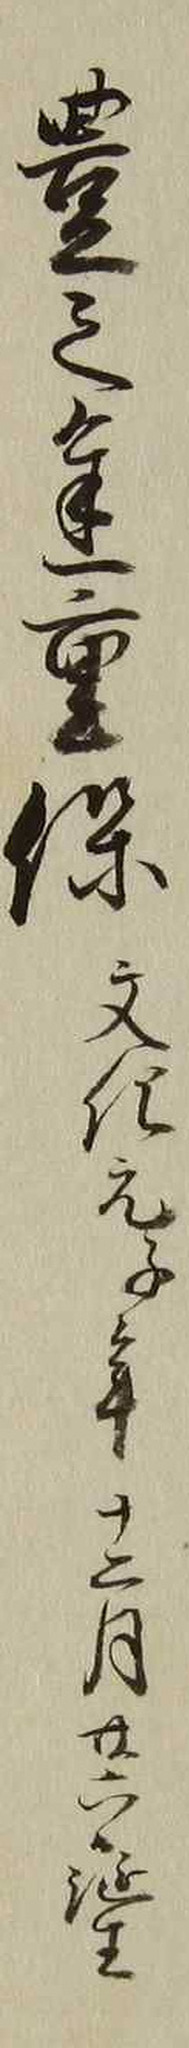豊之進重保文化元子年従十二月廿六日誕生
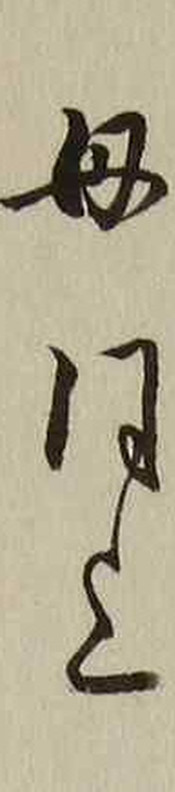母同上
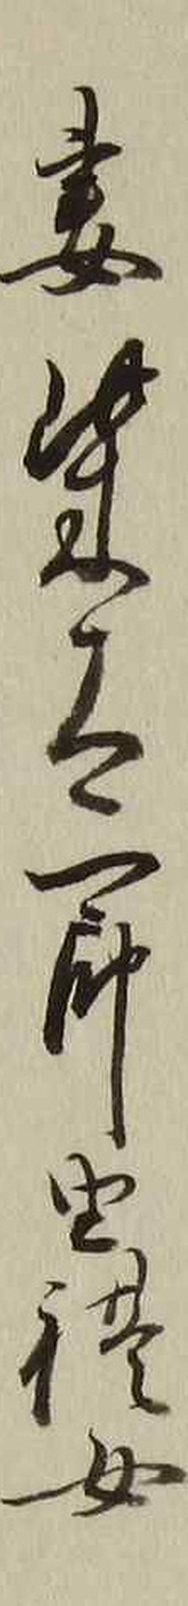妻柴太一郎由禮女
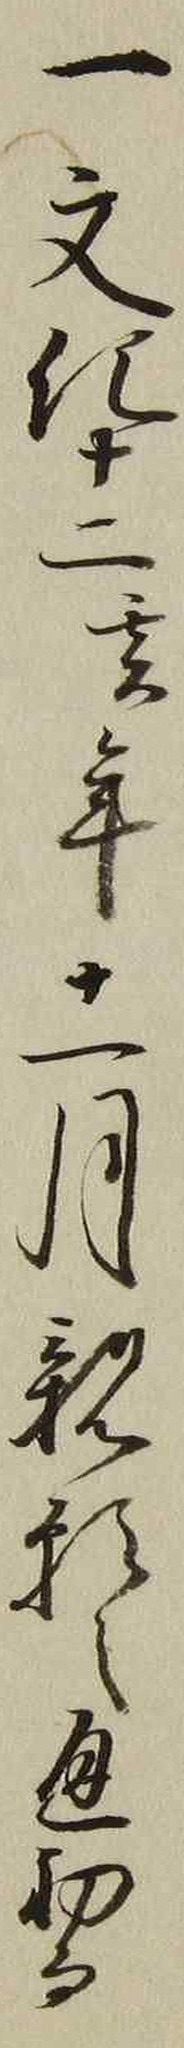一文化十二亥年十一月親願之通初而
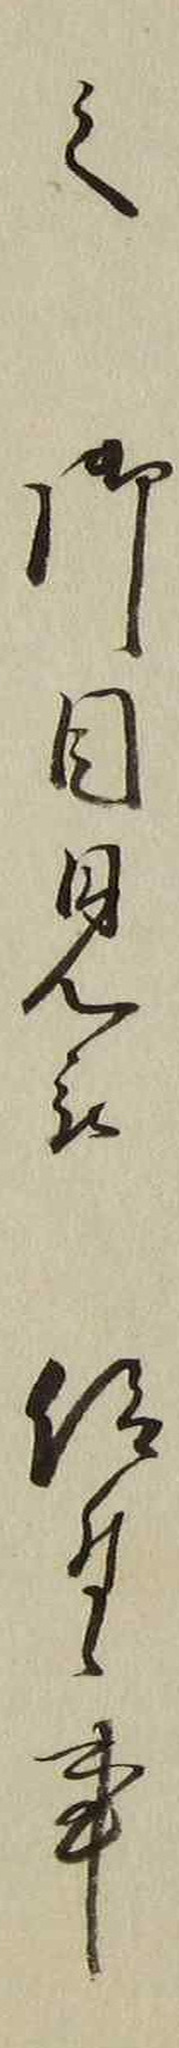之御目見被仰付候事
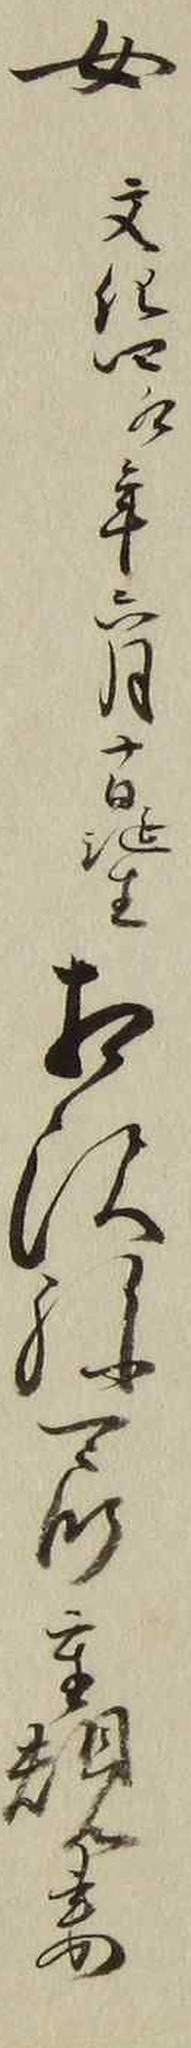女文化四卯年六月十日誕生相沢弥一郎重規妻
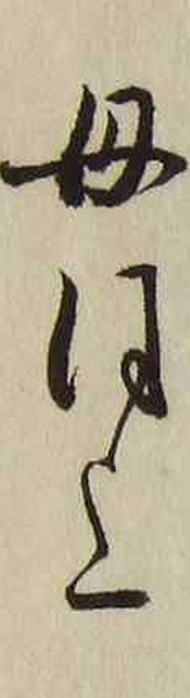母同上

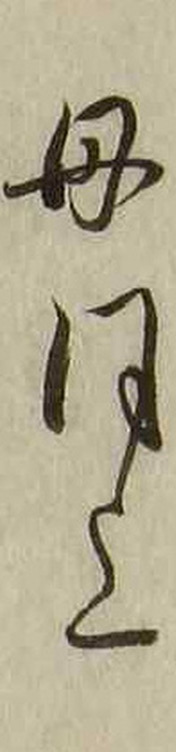母同上
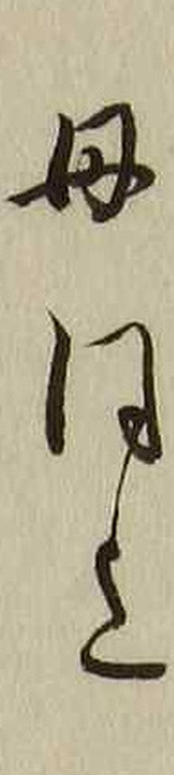母同上
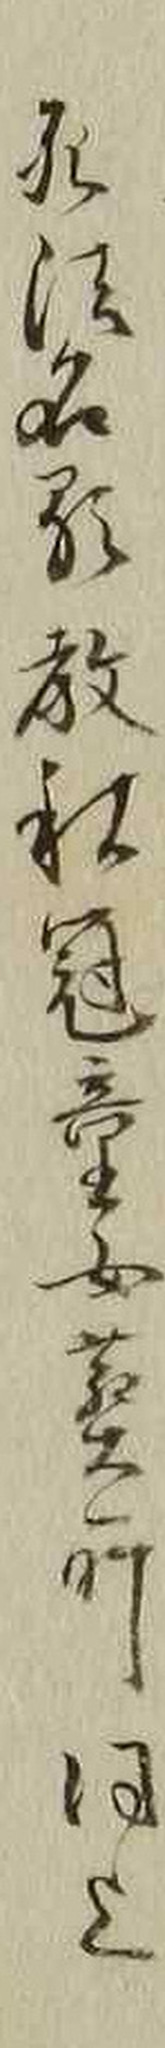死法名顕教秋冠童女葬所同上
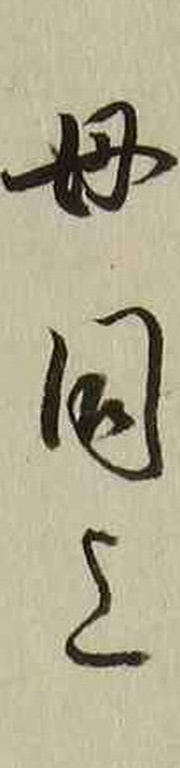母同上
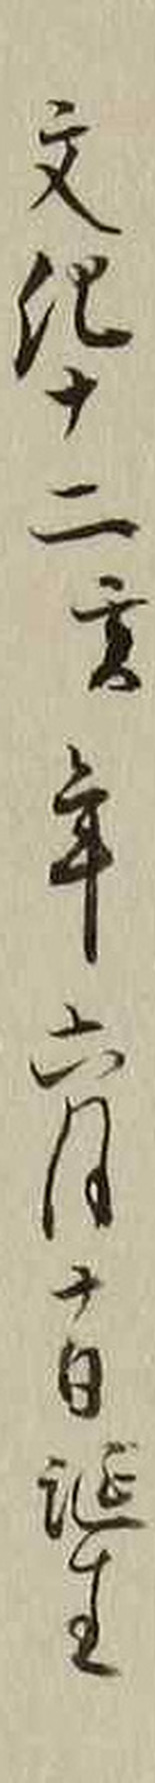女文化十二亥年六月十日誕生
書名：諸士系譜　巻之2　い之部2
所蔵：会津若松市立会津図書館
